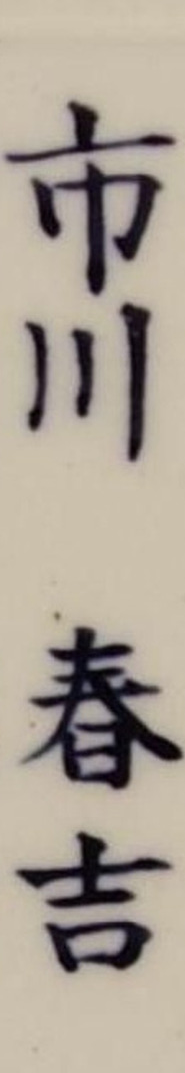市川春吉
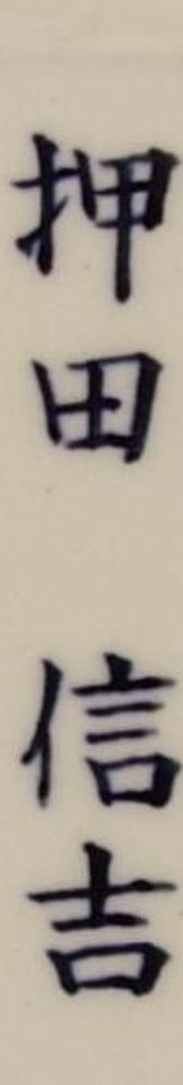押田信吉
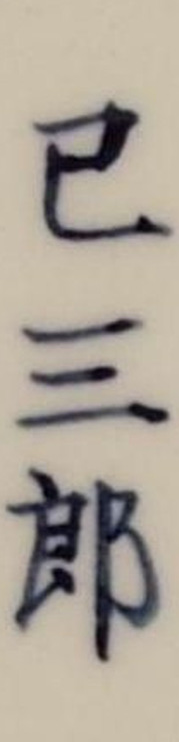巳三郎
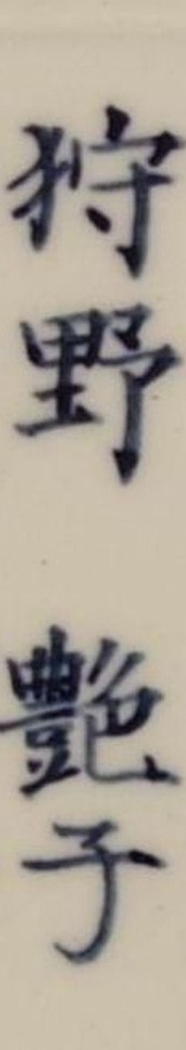狩野艶子
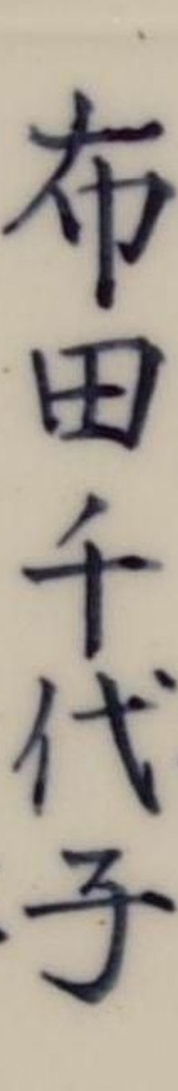布田千代子
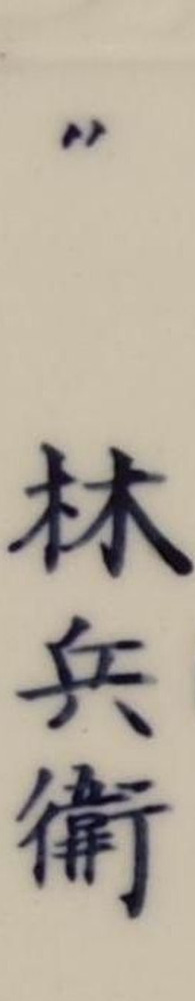林兵衛
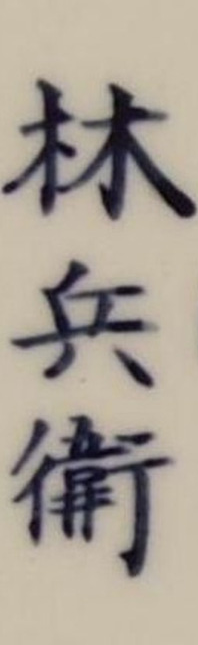林兵衛
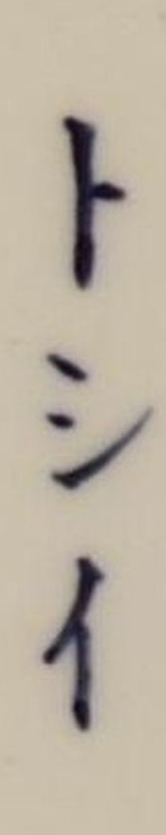トシイ
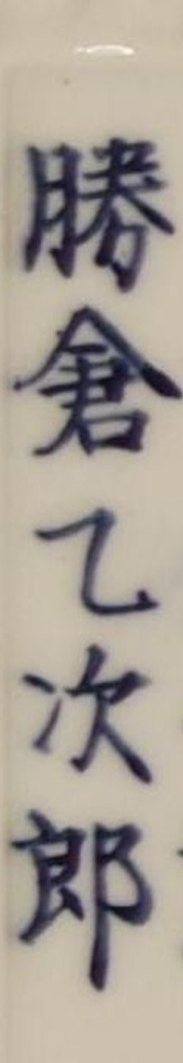勝倉乙次郎

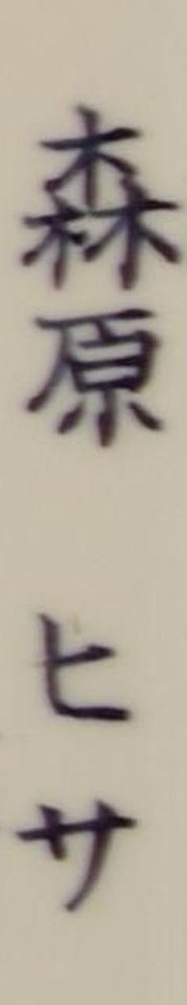森原ヒサ
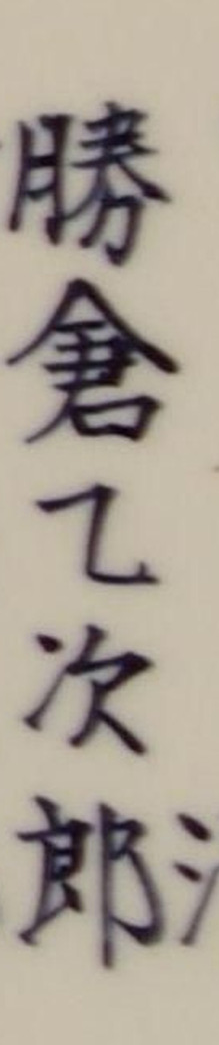勝倉乙次郎
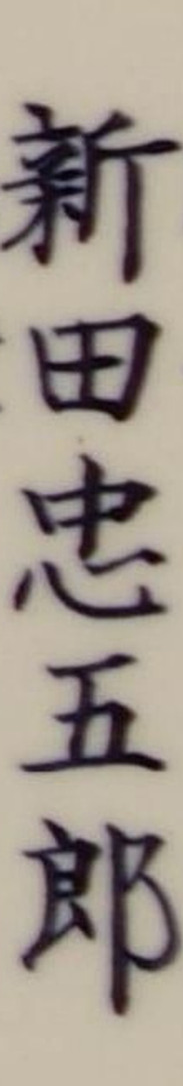新田忠五郎
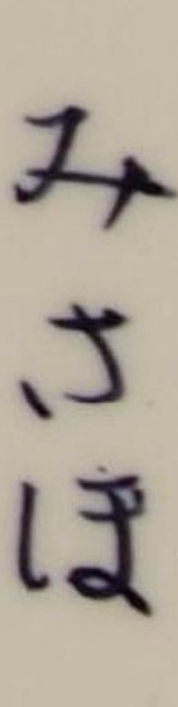みさほ
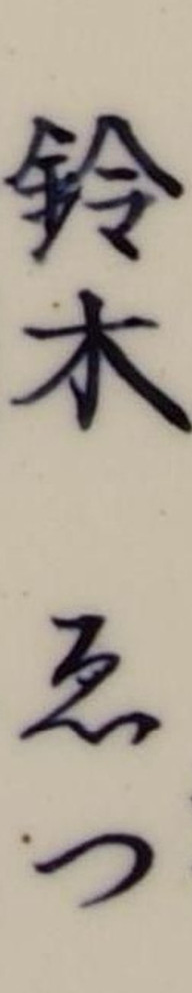鈴木えつ
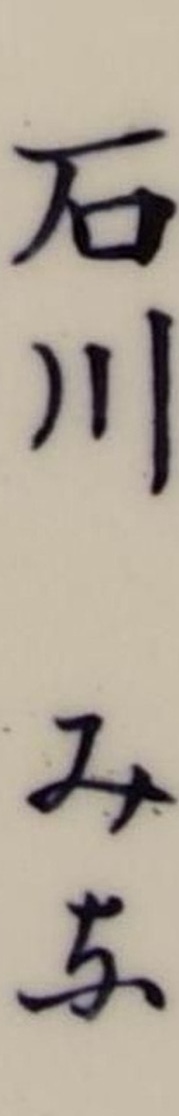石川みな
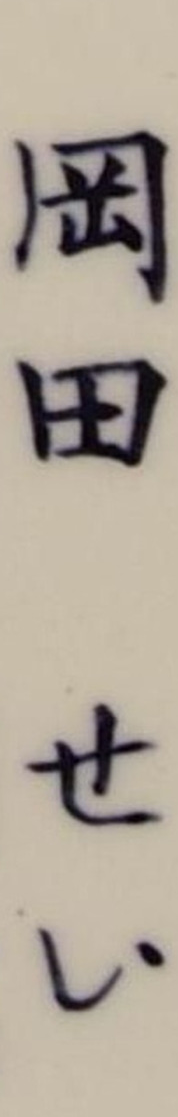岡田せい
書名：E~L
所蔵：高野山金剛峯寺
